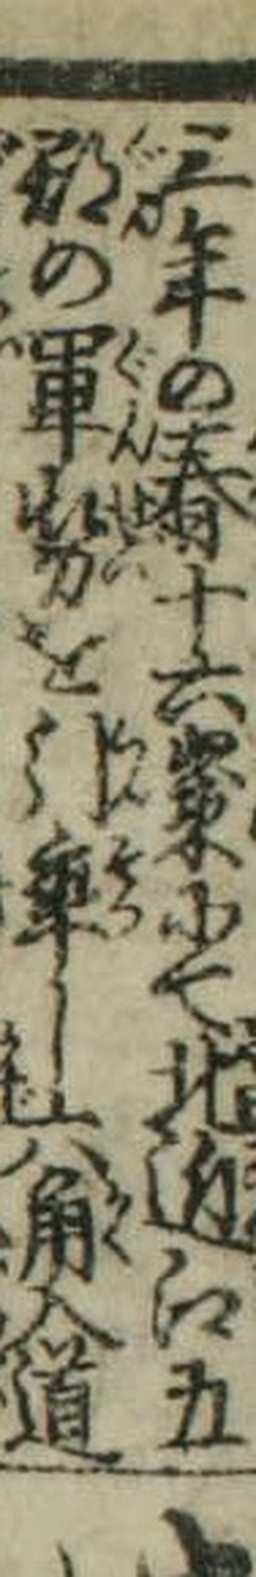郡の軍勢を引率し六角入道
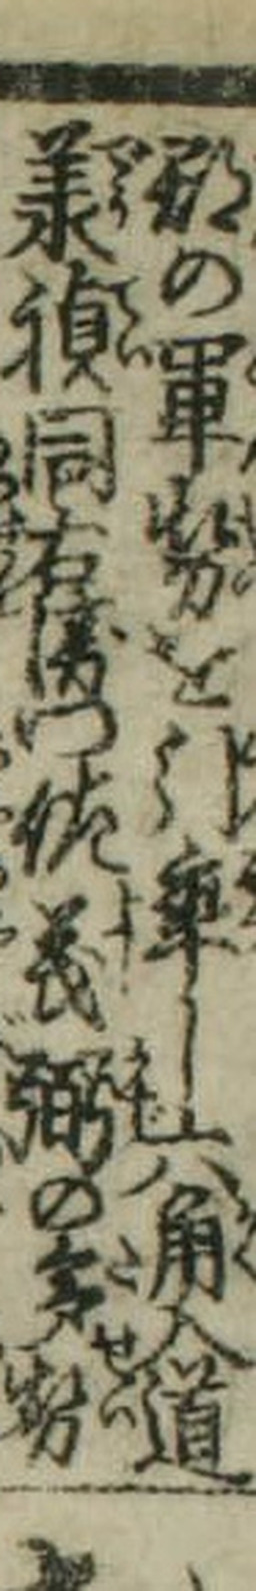承禎同右衛門佐義弼の多勢
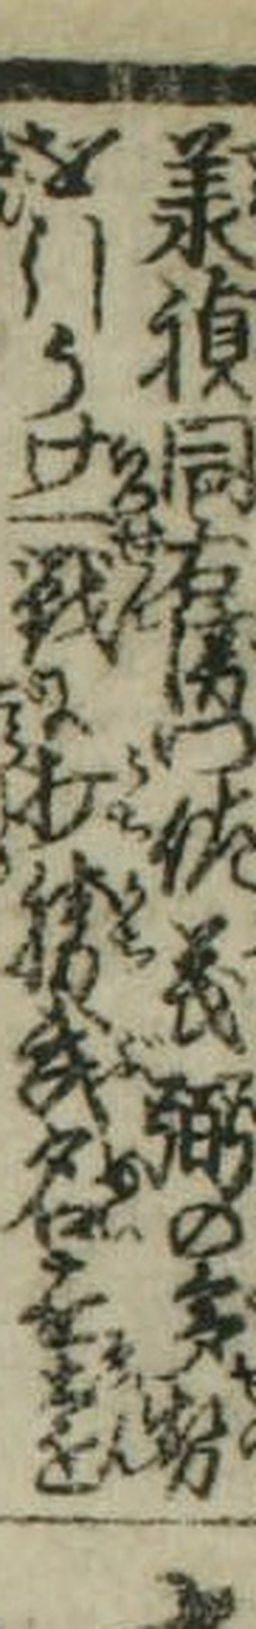を引うけ一戦に打勝武名を遠
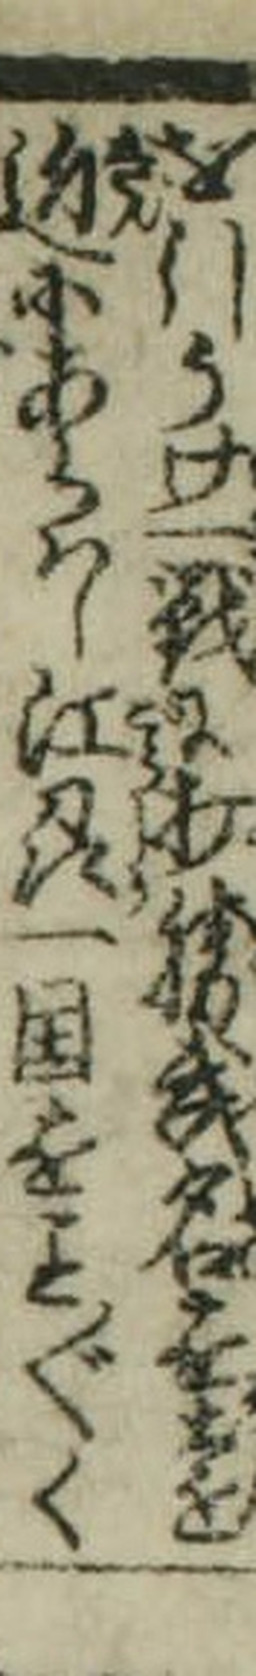近にあらはし江州一国をこと〴〵く
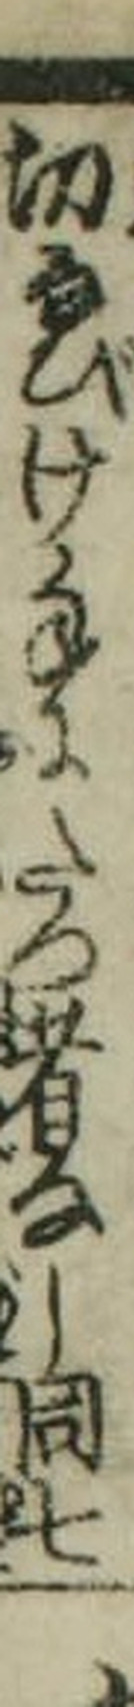切なびけ手にたつ者なし同七
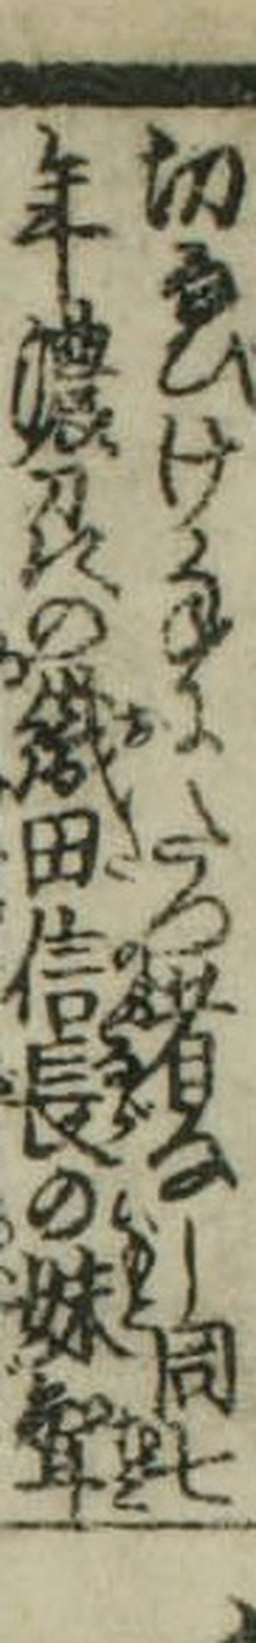年濃州の織田信長の妹聟
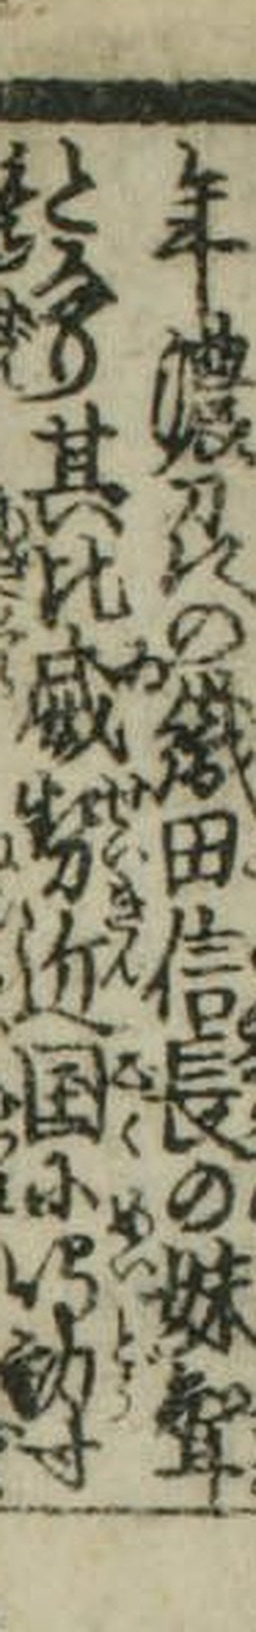となり其比威勢近国に鳴動す
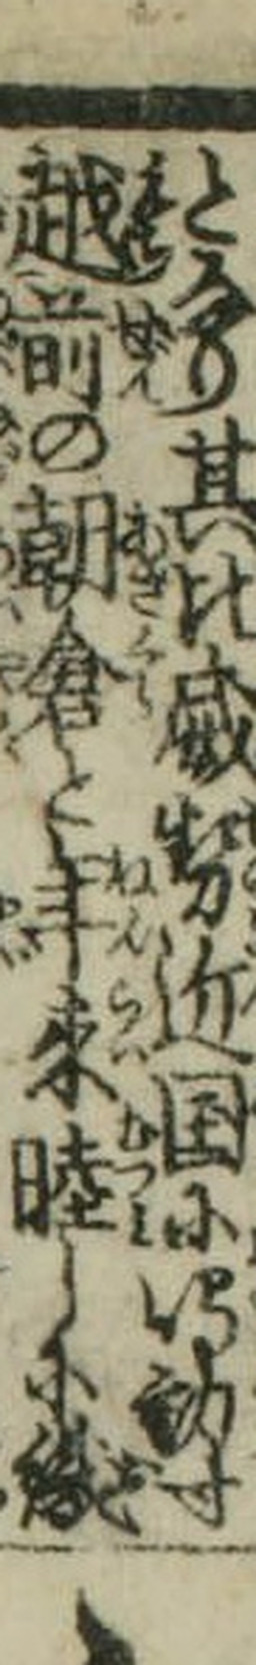越前の朝倉と年来睦しに織
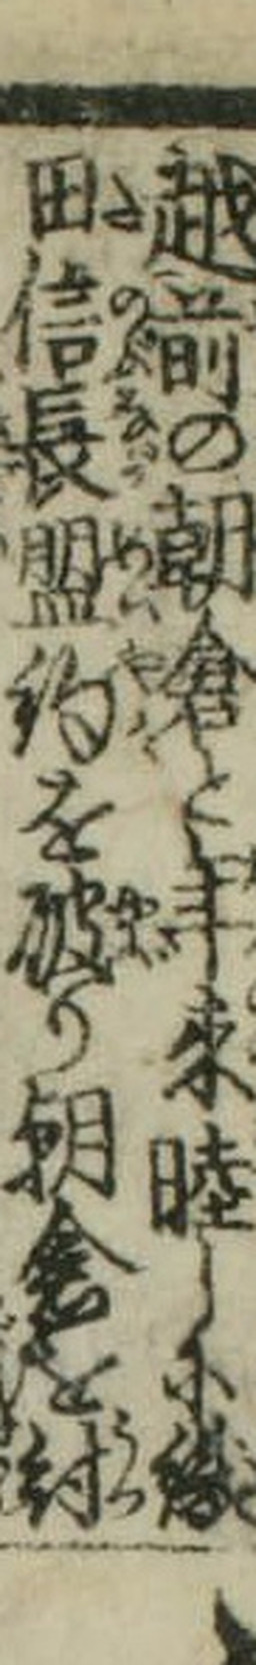田信長盟約を破り朝倉を討
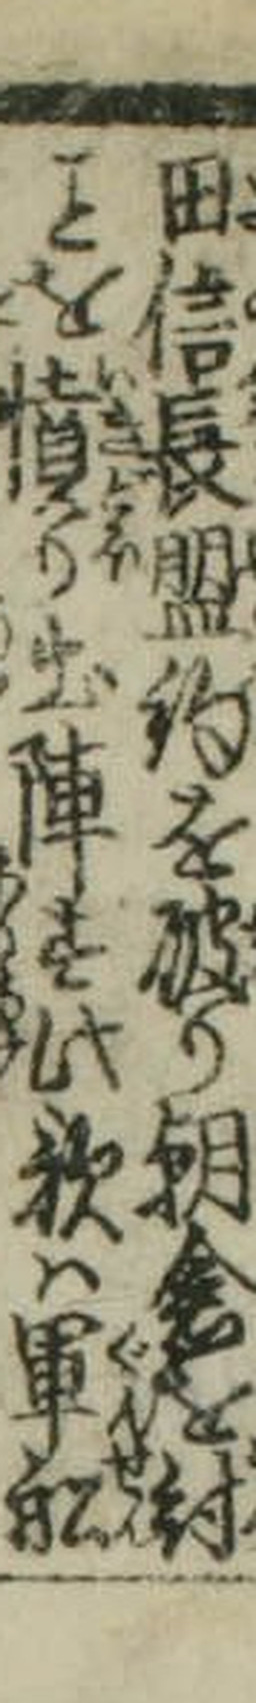ことを憤り出陣す此歌は軍船
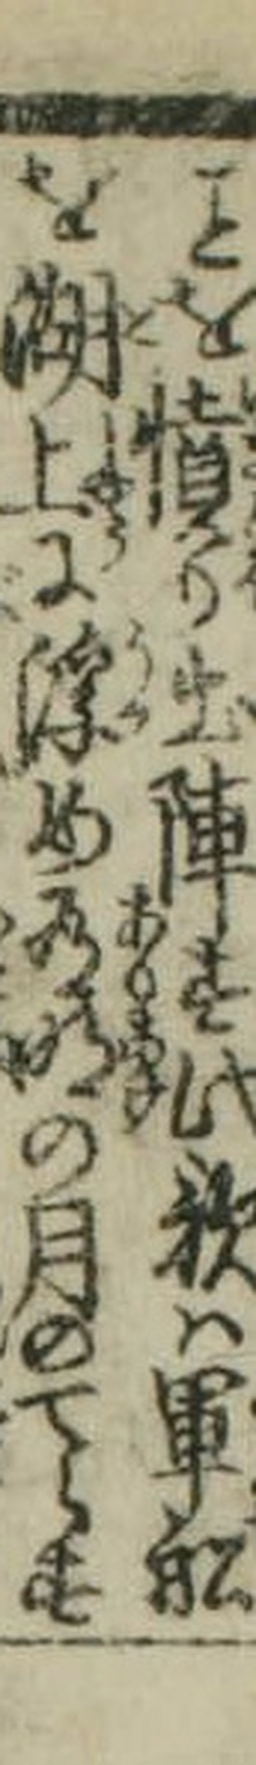を湖上に浮め有明の月のてらす
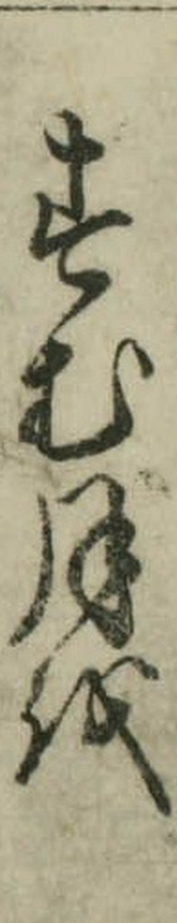すむ月を
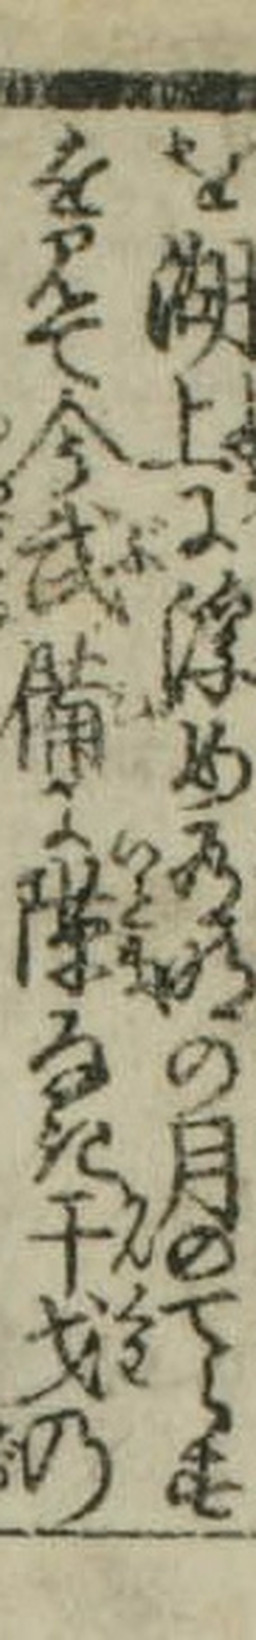を見て今武備に隙なき干戈の
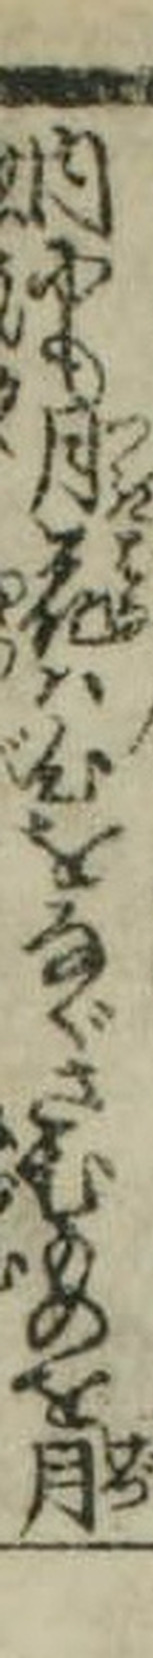内にも月花は心をなぐさむものを月
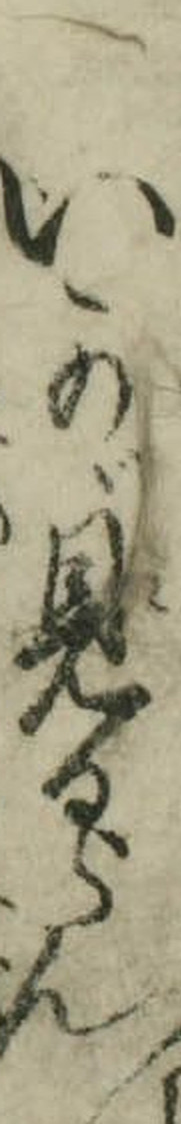いかゞ見るらん
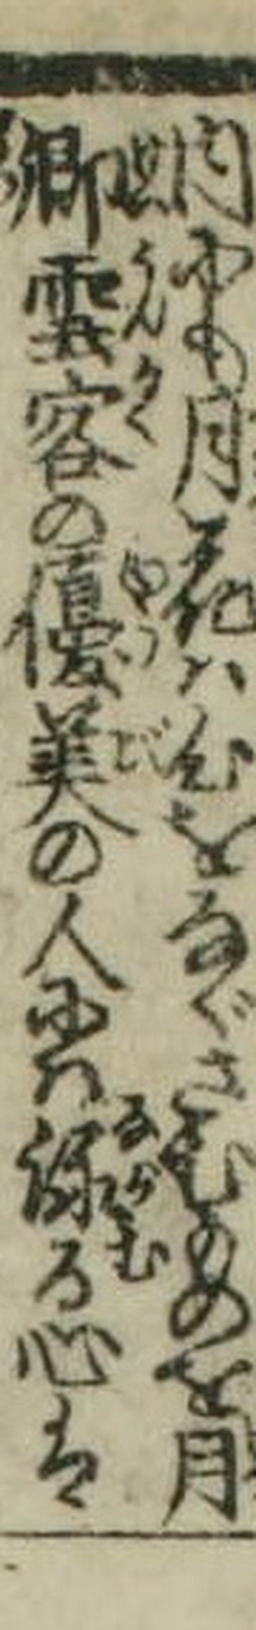卿雲客の優美の人には詠る心は
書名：續英雄百人一首
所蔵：東京学芸大学附属図書館
